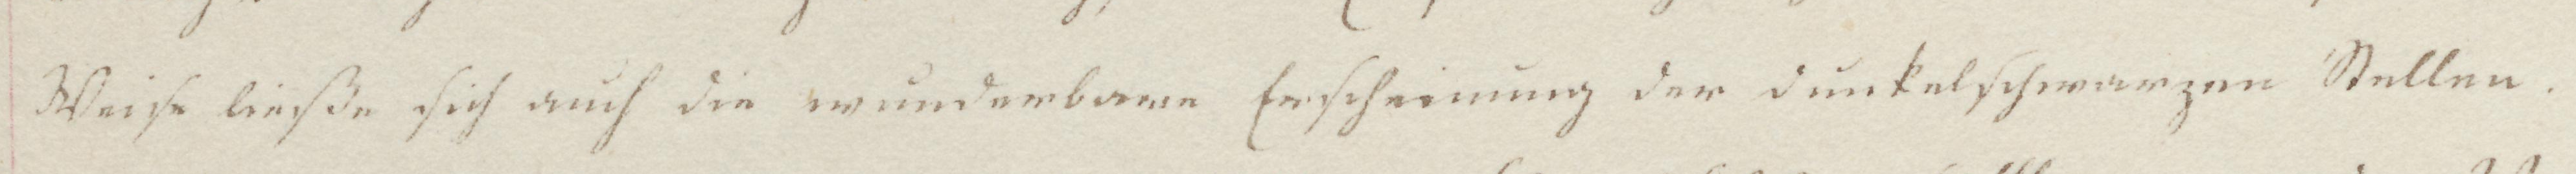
Weise ließe sich auch die wunderbare Erscheinung der dunkelschwarzen Stellen,
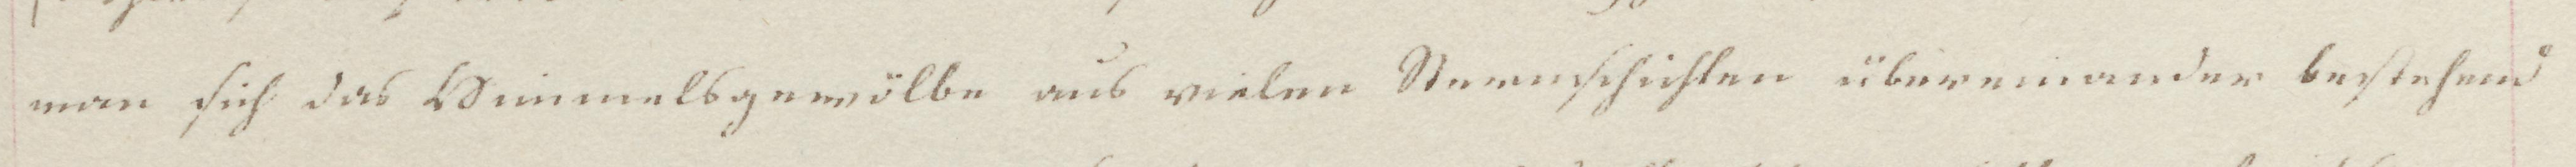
man sich das Himmelsgewölbe aus vielen Sternschichten übereinander bestehend
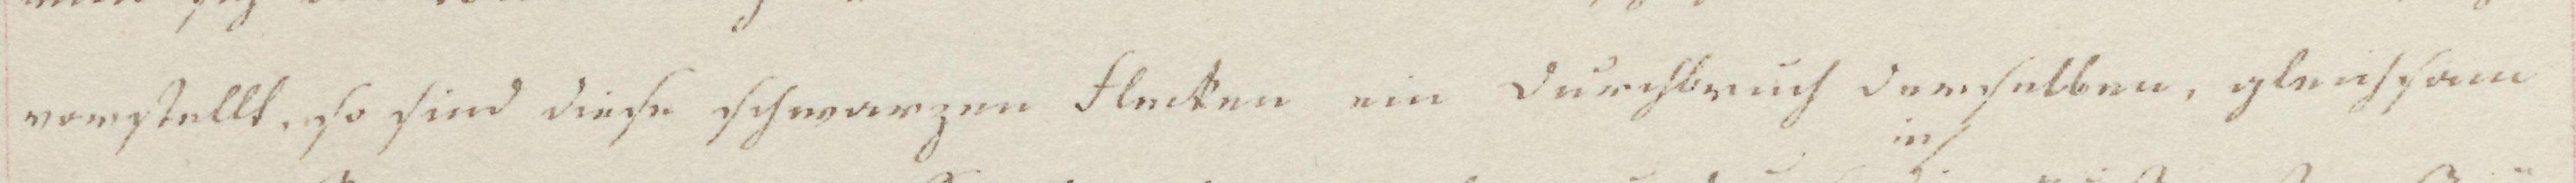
vorstellt, so sind diese schwarzen Flecken ein Durchbruch derselben, gleichsam
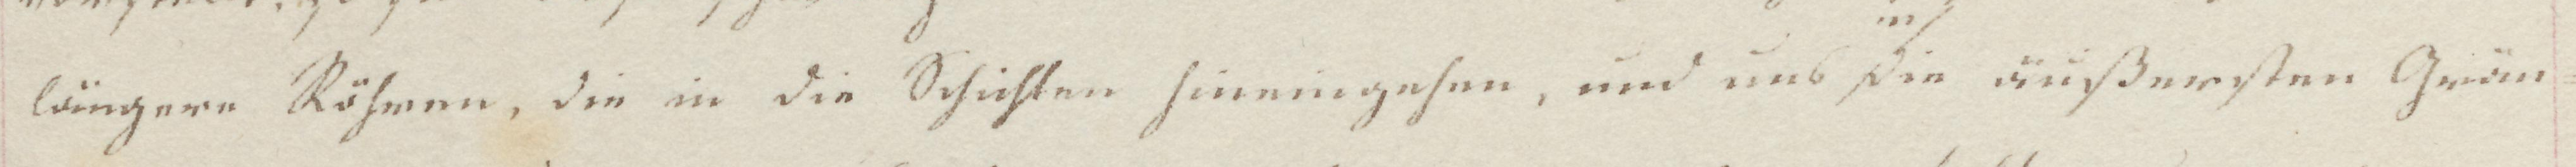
längere Röhren, die in die Schichten hineingehen, und uns in die äußersten Grän-
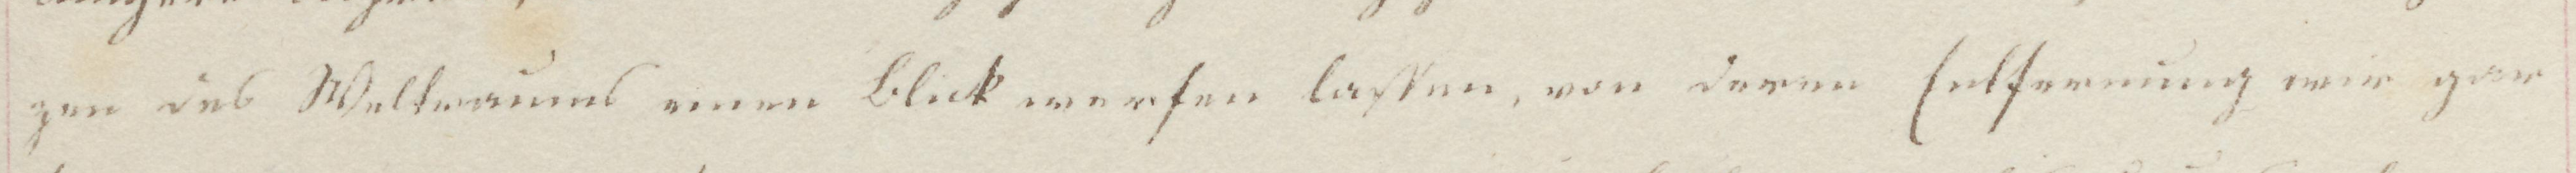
zen des Weltraums einen Blick werfen lassen, von deren Entfernung wir gar
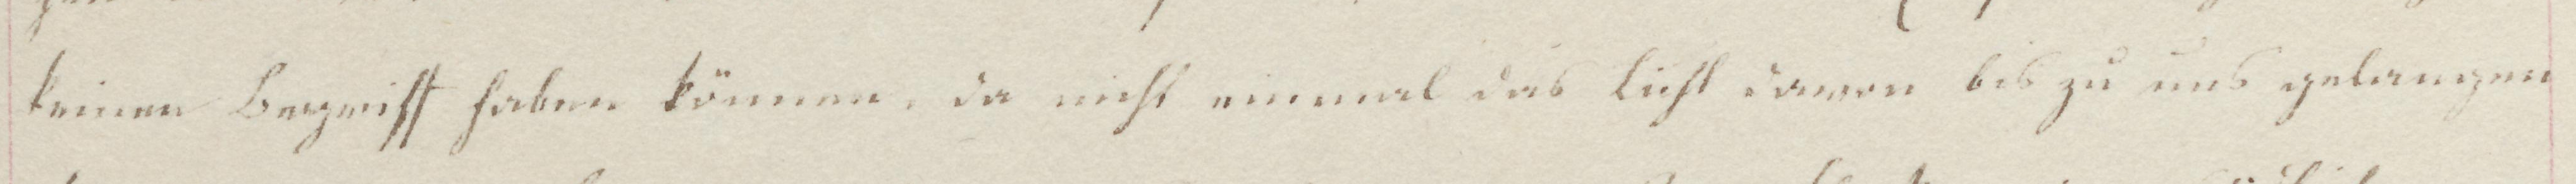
keinen Begriff haben können, da nicht einmal das Licht davon bis zu uns gelangen
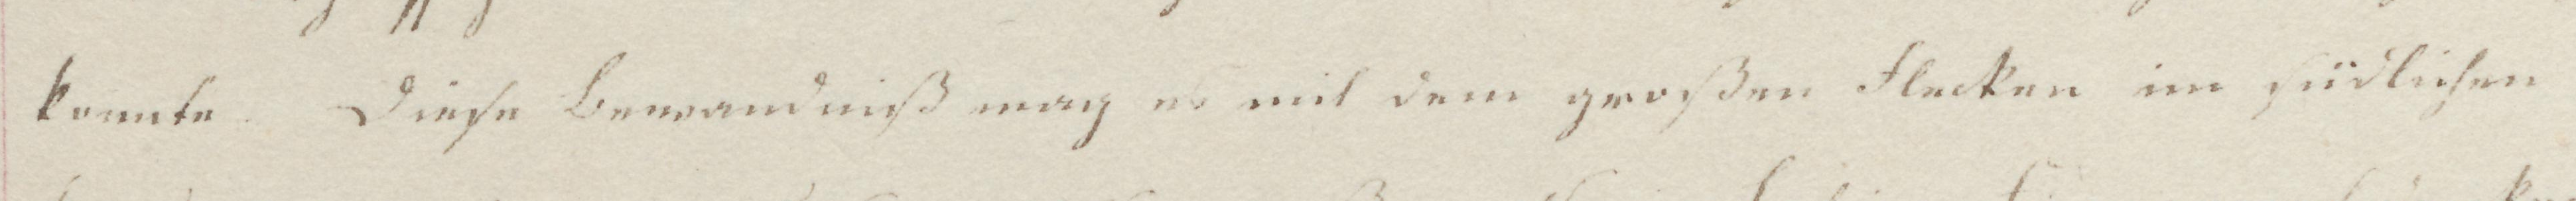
konnte. Diese Bewandniß mag es mit dem großen Flecken im südlichen
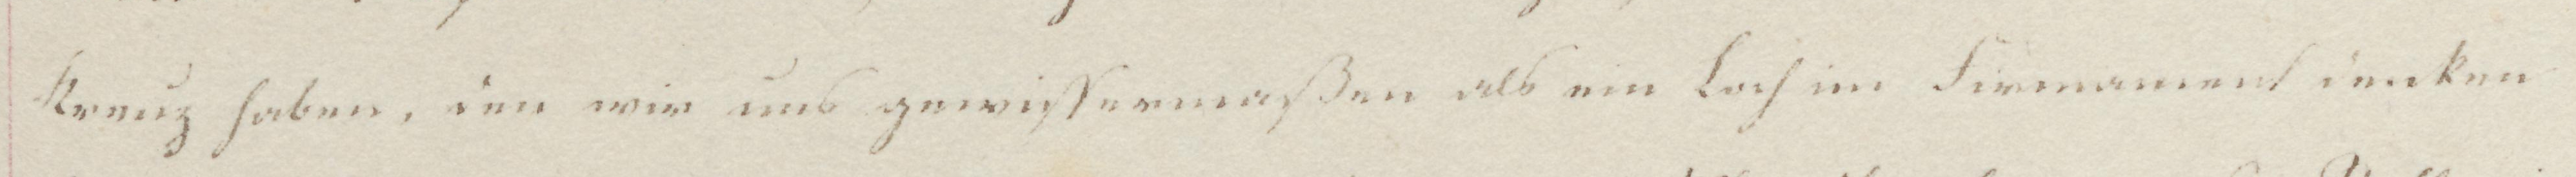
Kreuz haben, den wir uns gewissermaßen als ein Loch im Firmament denken
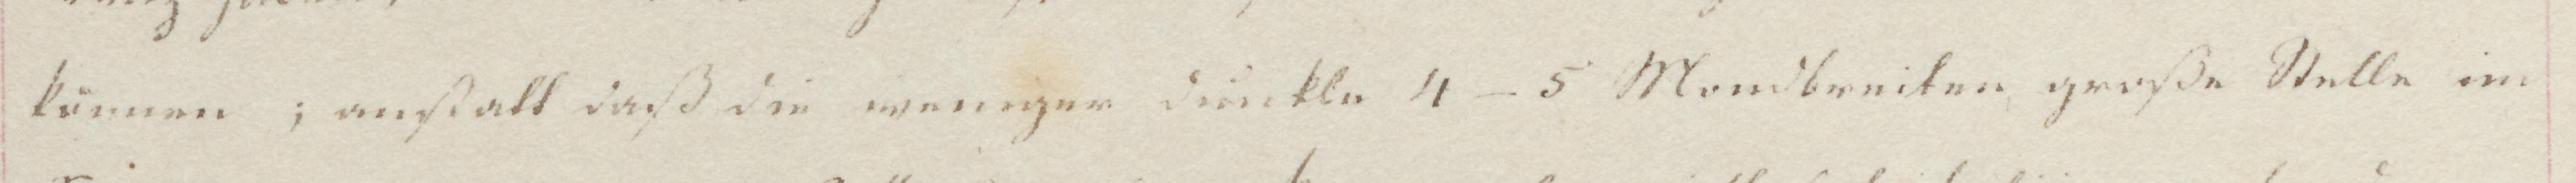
können; anstatt daß die weniger dunkle 4–5 Mondbreiten große Stelle im
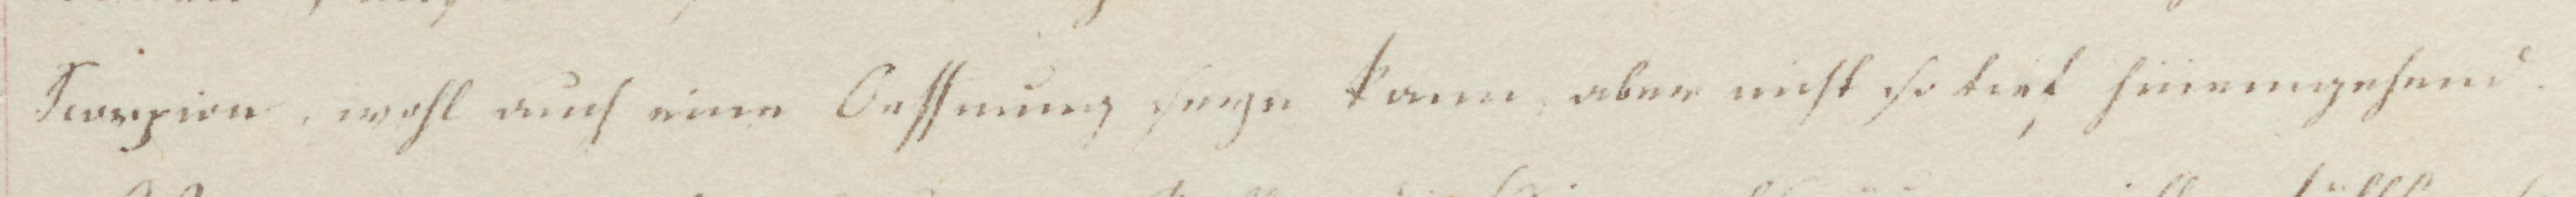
Scorpion, wohl auch eine Oeffnung sein kann, aber nicht so tief hineingehend.
